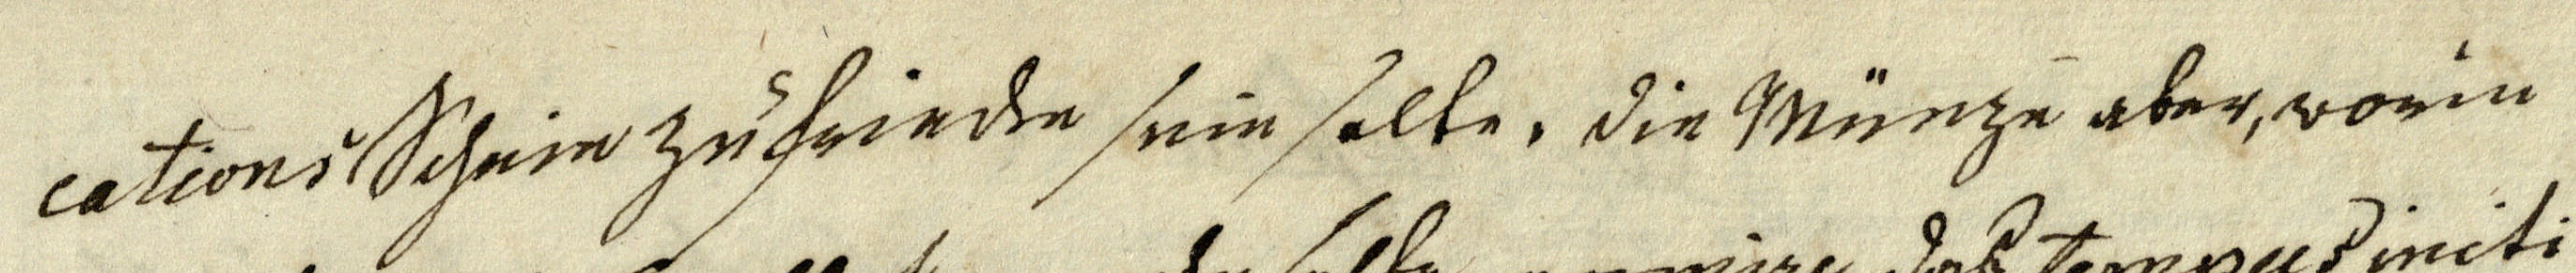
cations Schein zufrieden sein solte, die Münze aber, worin
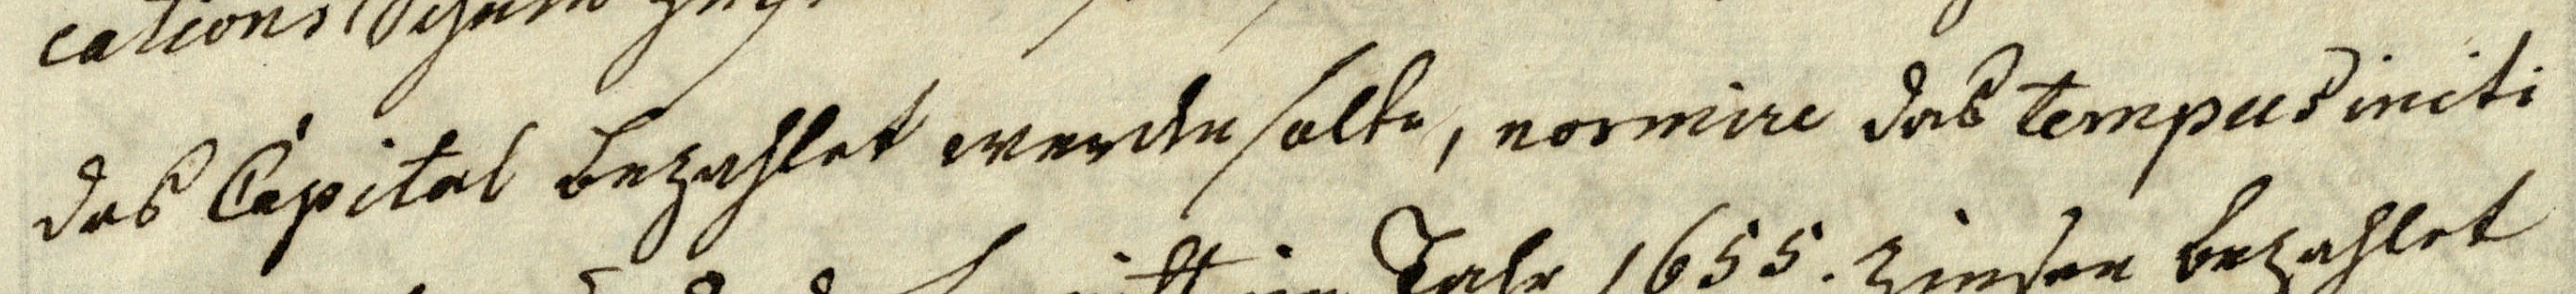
das Capital bezahlet werden solte, normire das tempus initi
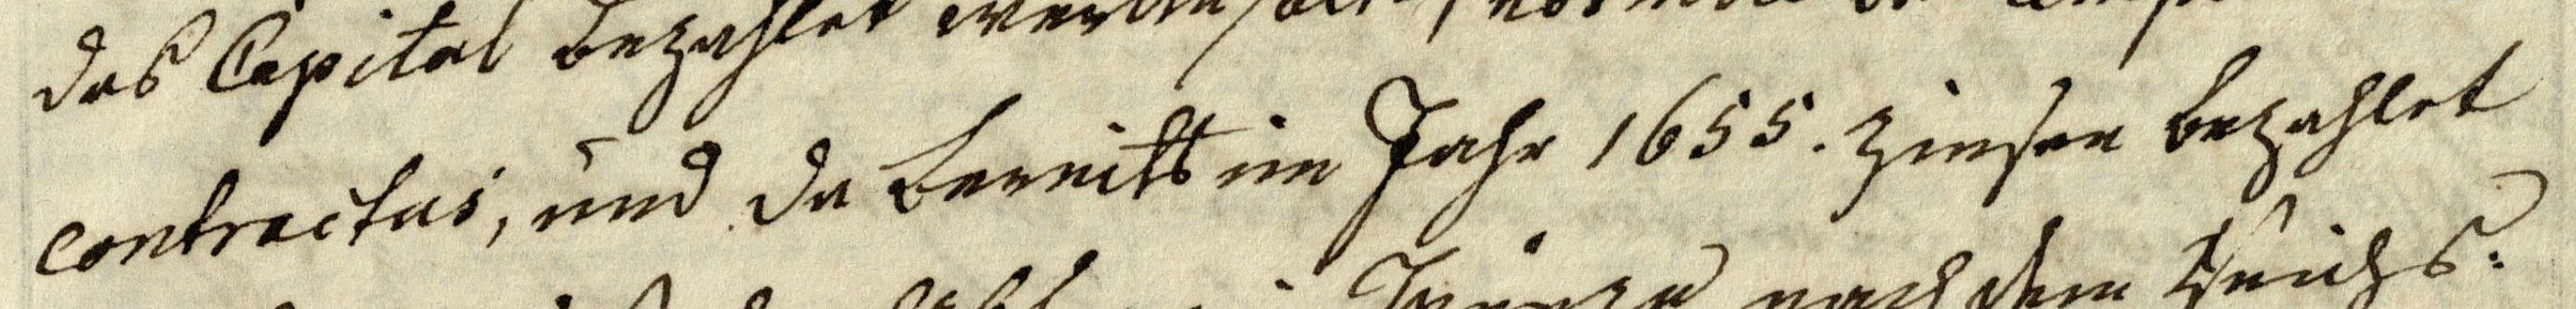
contractus, und da bereits im Jahre 1655. Zinsen bezahlet
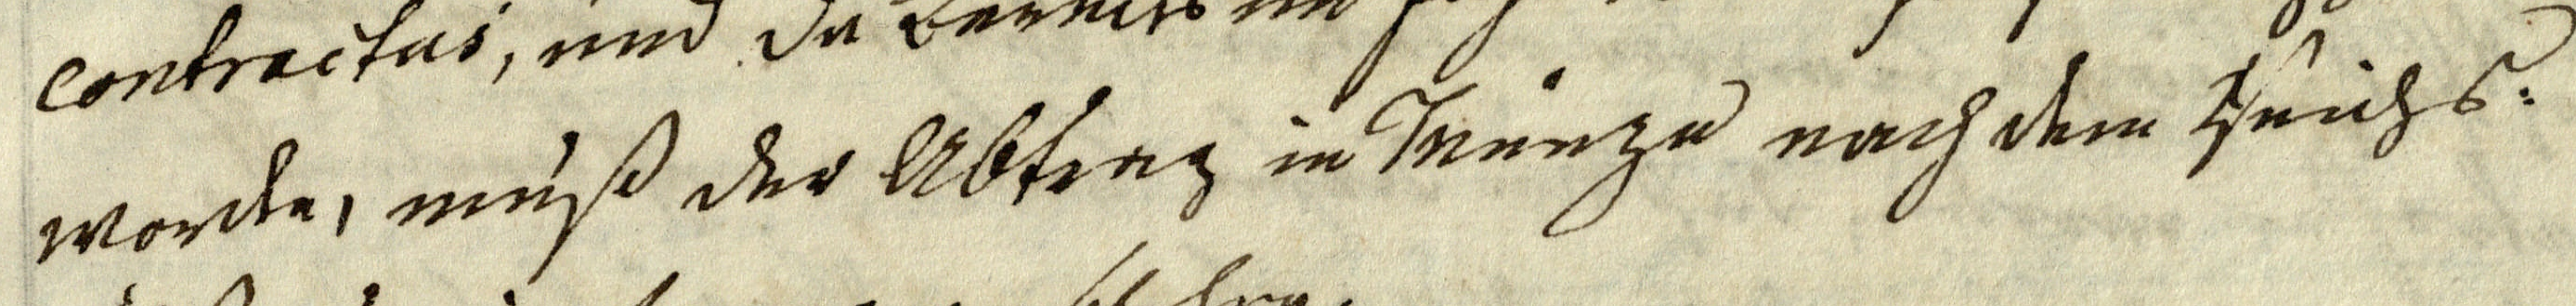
worden, muß der Abtrag in Münze nach dem Reichs¬
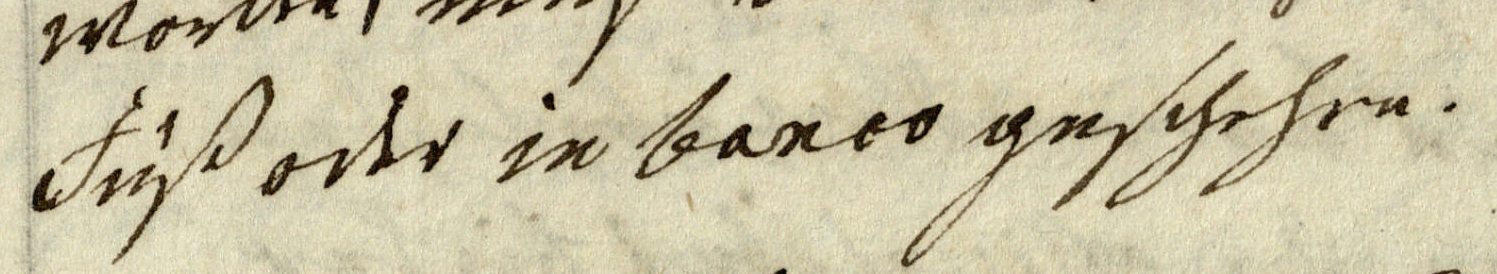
Fuß oder in banco geschehen.
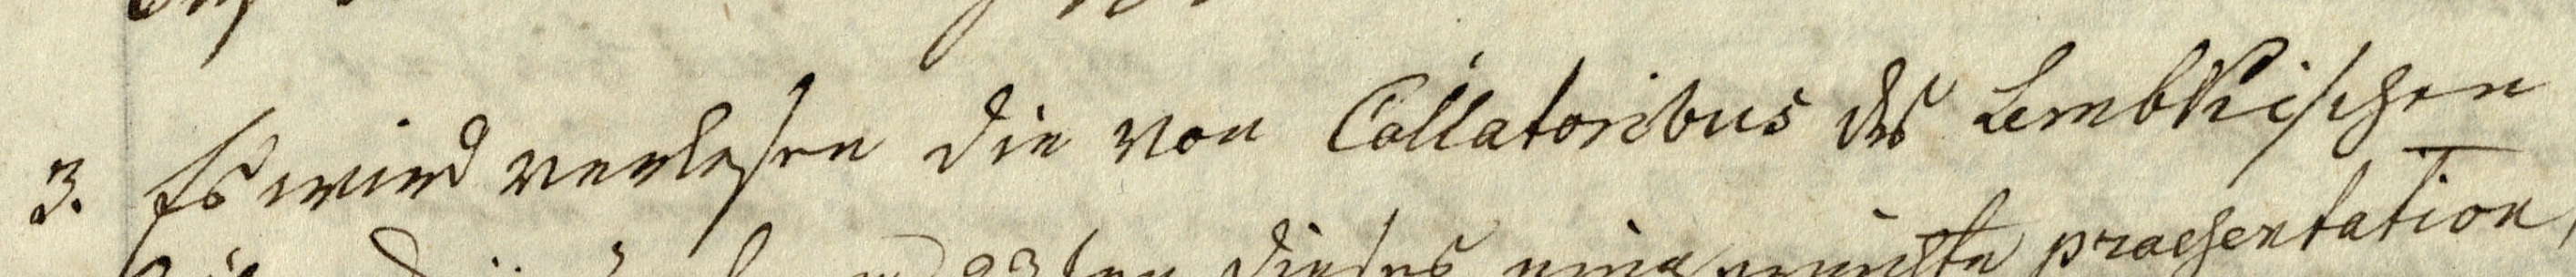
3. Es wird verlesen die von Collatoribus des Lembkischen
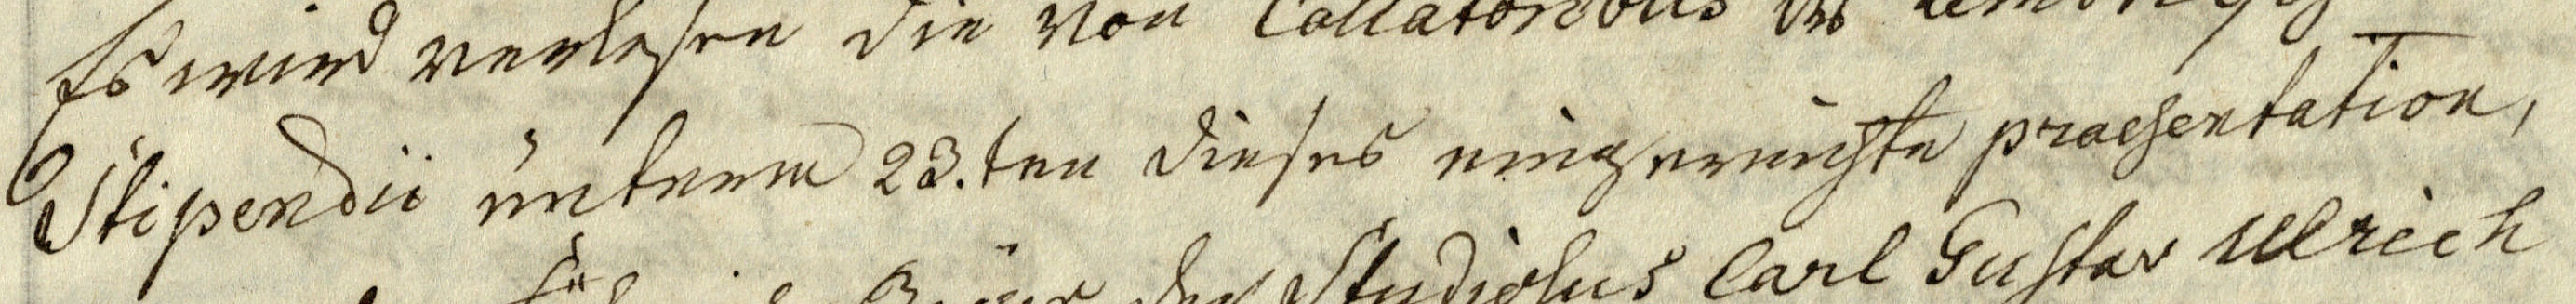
Stipendii unterm 23. ten dieses eingereichte praesentation
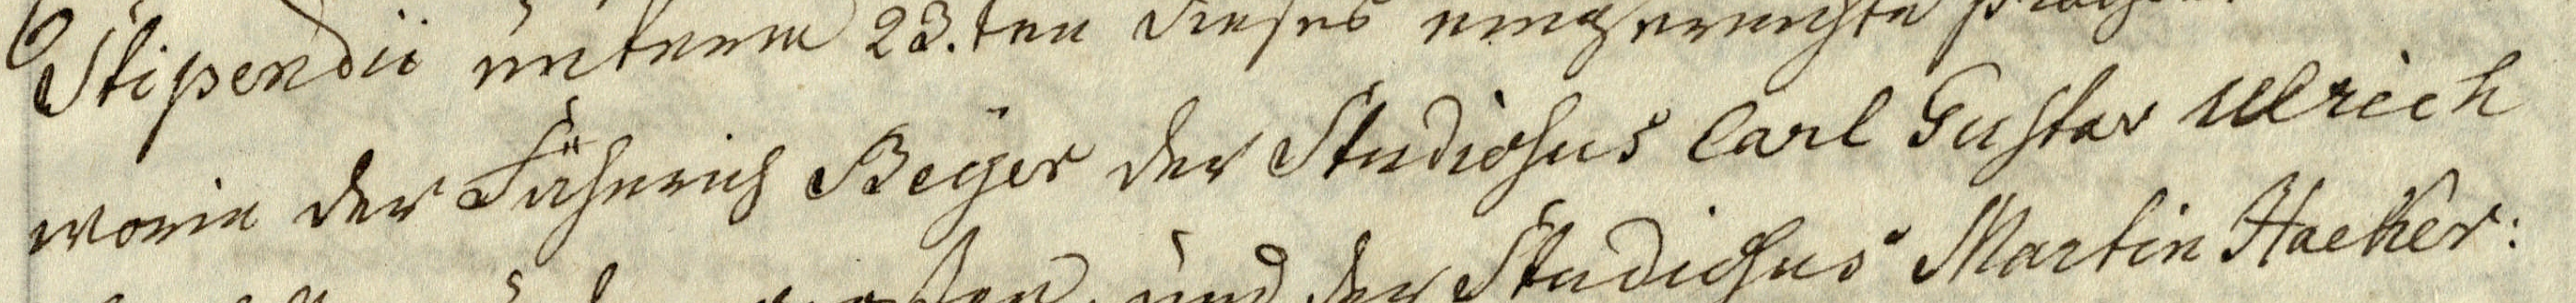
worin der Fähnrich Beÿer der Studiosus Carl Gustav Ulrich
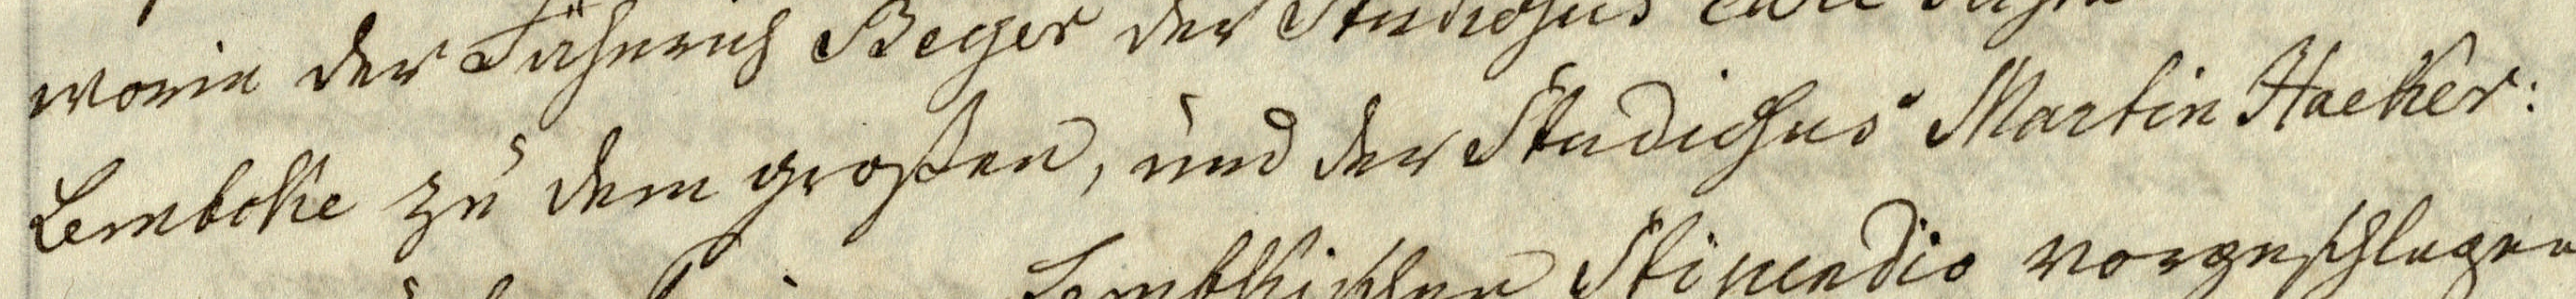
Lembcke zu dem großen, und der Studiosus Martin Haeker¬
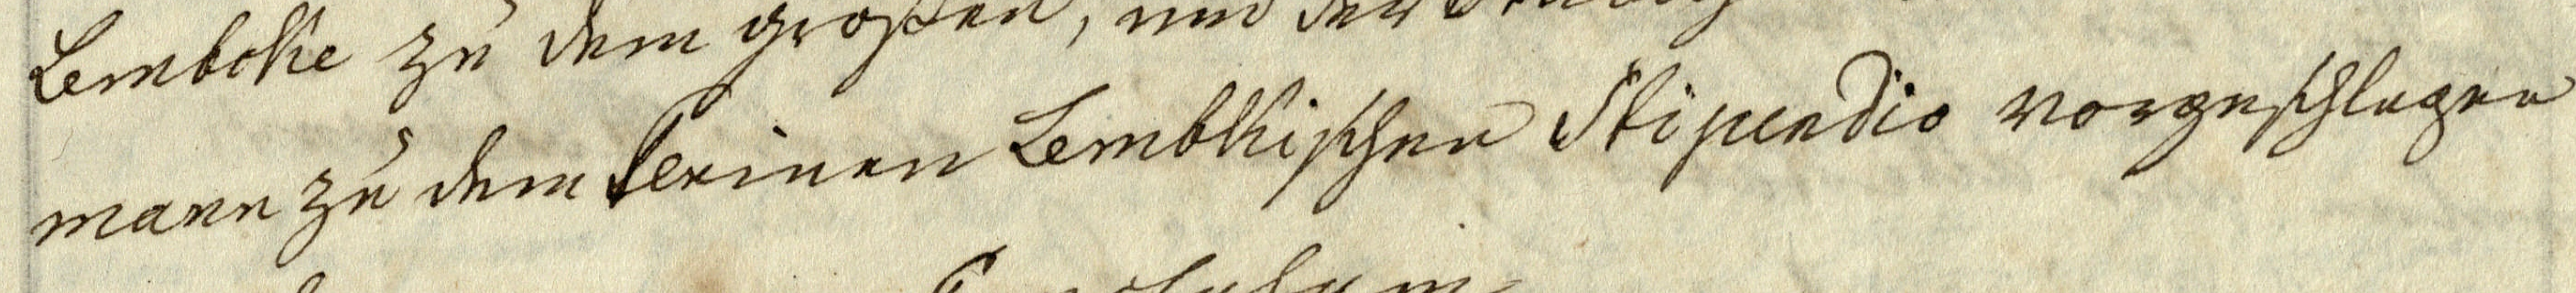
mann zu dem kleinen Lembkischen Stipendio vorgeschlagen
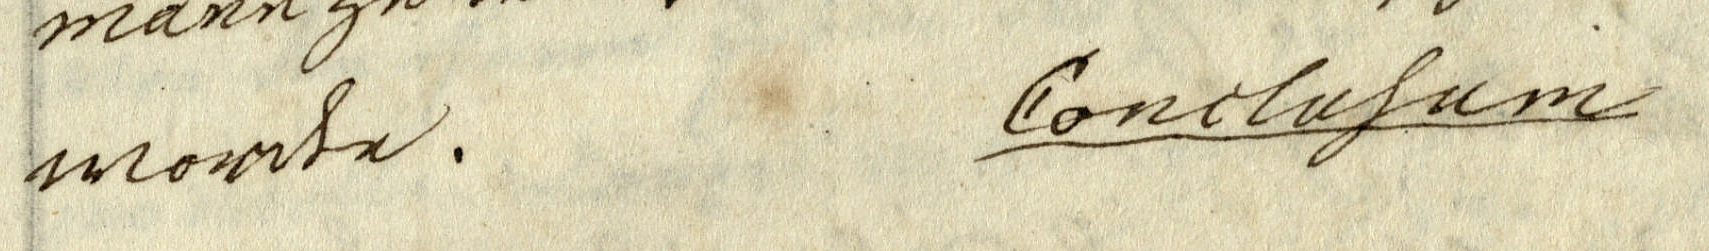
worden. Conclusum
